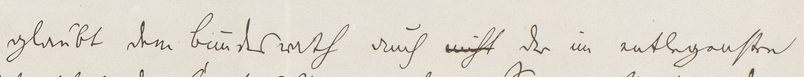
glaubt dem Bundesrath auch nicht der im entlegensten
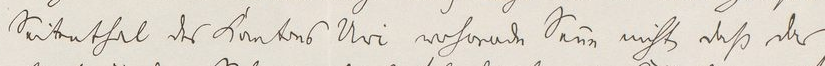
Seitenthal des Kantons Uri wohnende Senne nicht, daß das
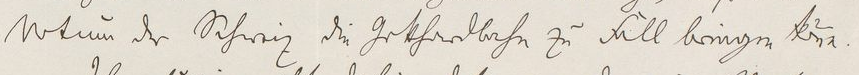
Votum der Schweiz die Gotthardbahn zu Fall bringen könne.
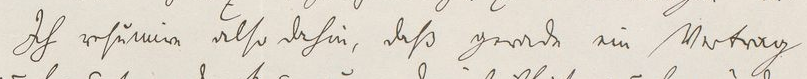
Ich resümire also dahin, daß gerade ein Vertrag
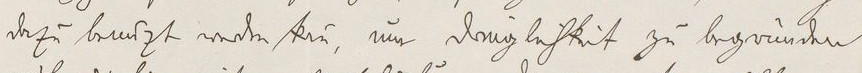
dazu benuzt werden kann, um Dringlichkeit zu begründen
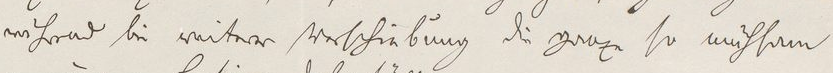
während bei weiterer Verschiebung die ganze so mühsam
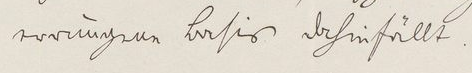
errungene Basis dahinfällt.
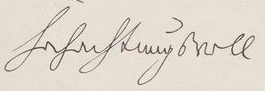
Hochachtungsvoll
